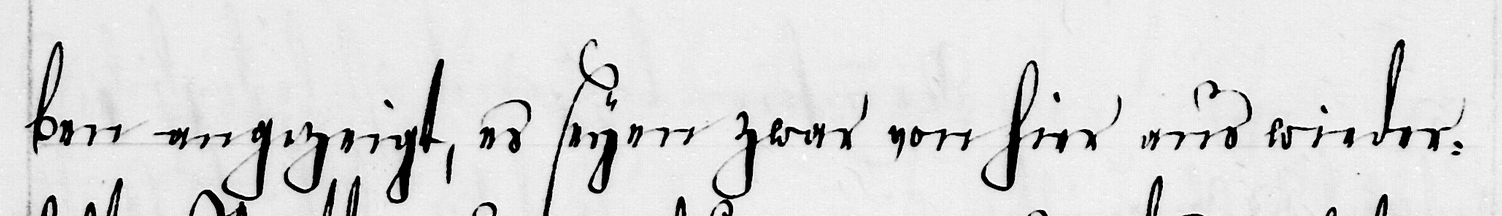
ben angezeigt, es seyen zwar von hier aus wieder¬
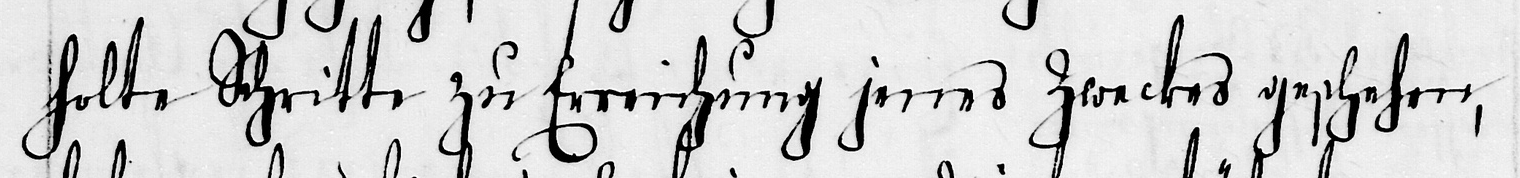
holte Schritte zu Erreichung jenes Zweckes geschehen,
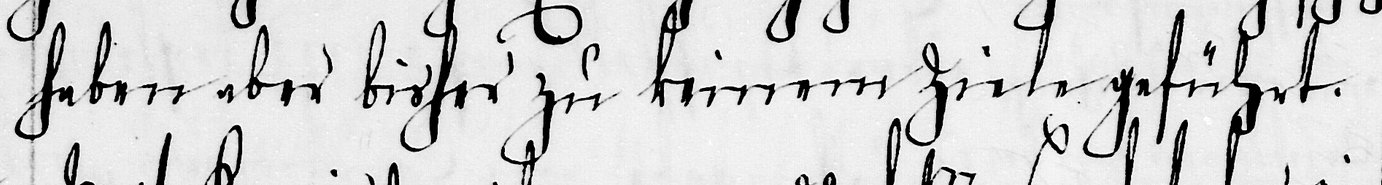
haben aber bisher zu keinem Ziele geführt.
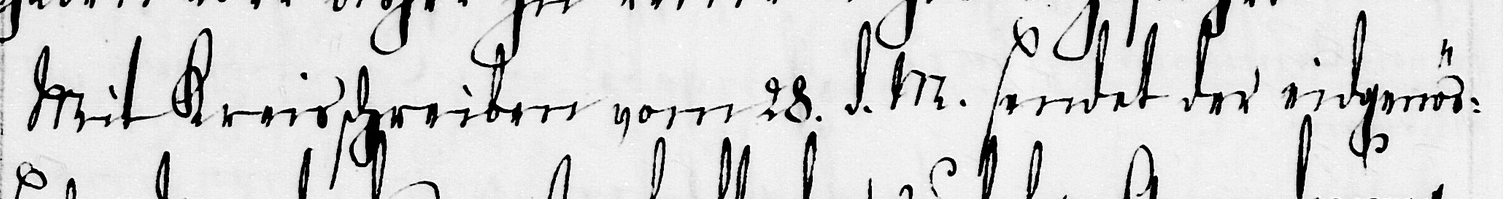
Mit Kreisschreiben vom 28 d. M. sendet der eidgenöß¬
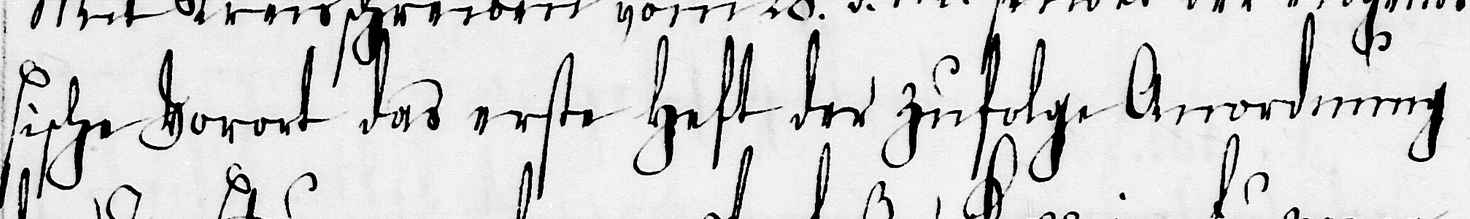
ische Vorort das erste Heft der zu folge Anordnung
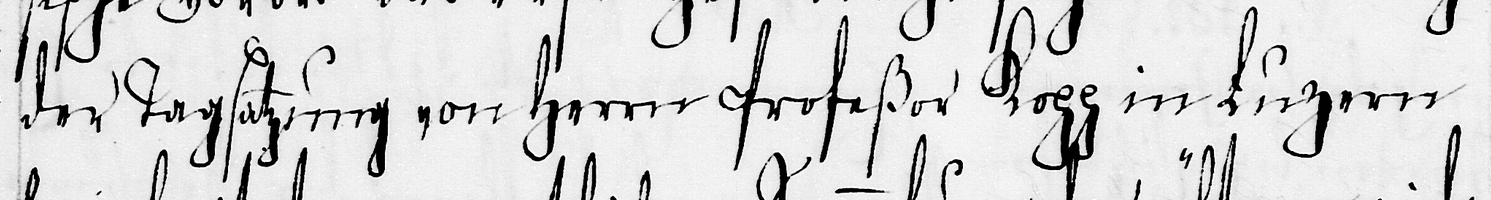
der Tagsatzung von Herrn Profeßor Kopp in Luzern
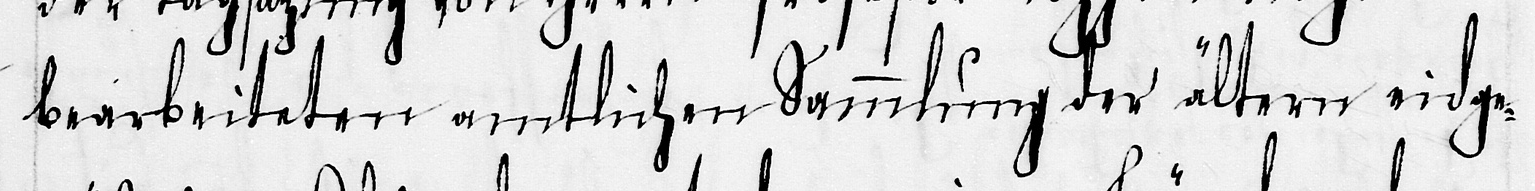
bearbeiteten amtlichen Sammlung der ältern eidge¬
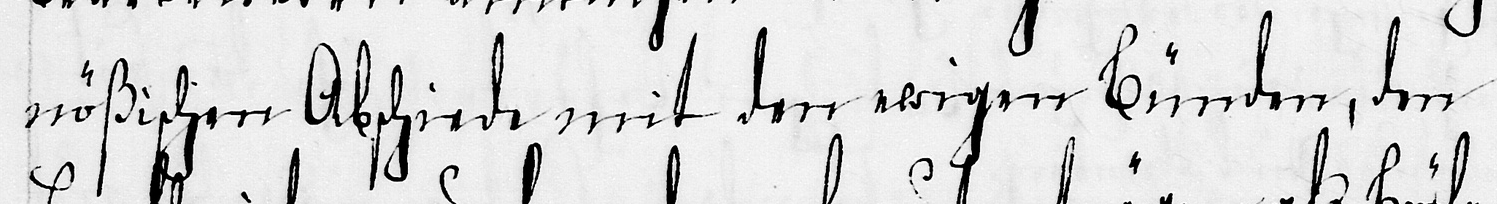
nößischen Abschiede mit den ewigen Bünden, den
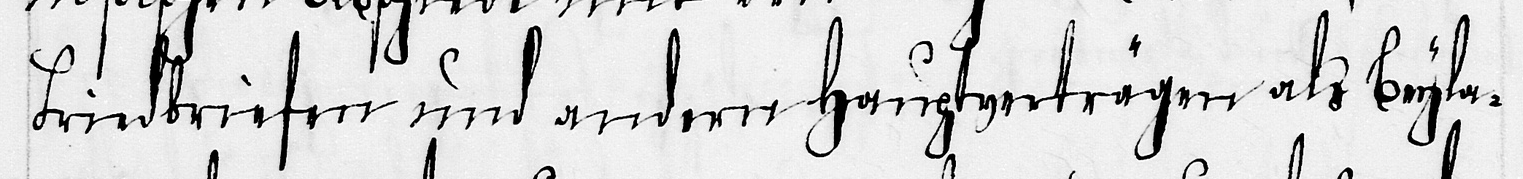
Friedbriefen und andern Hauptverträgen als Beyla¬
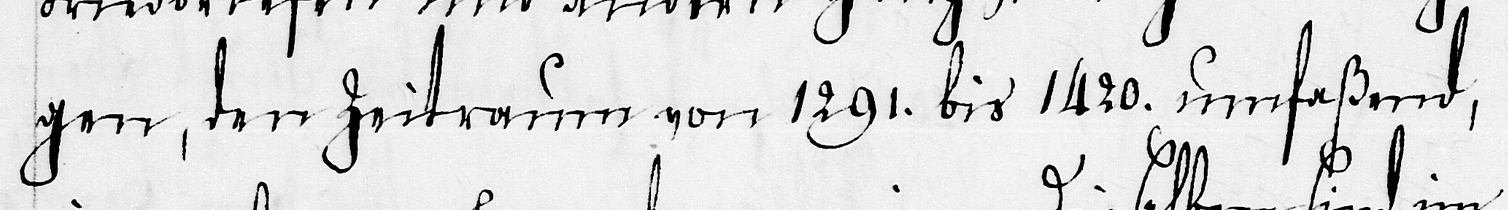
gen, den Zeitraum von 1291. bis 1420. umfaßend,
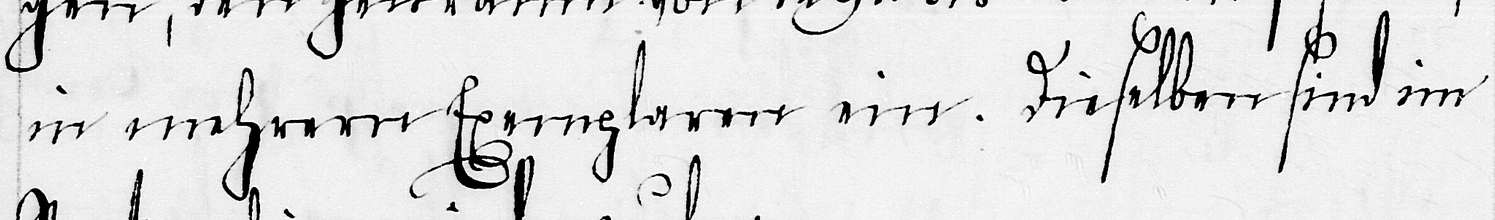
in mehrern Exemplaren ein. Dieselben sind im
